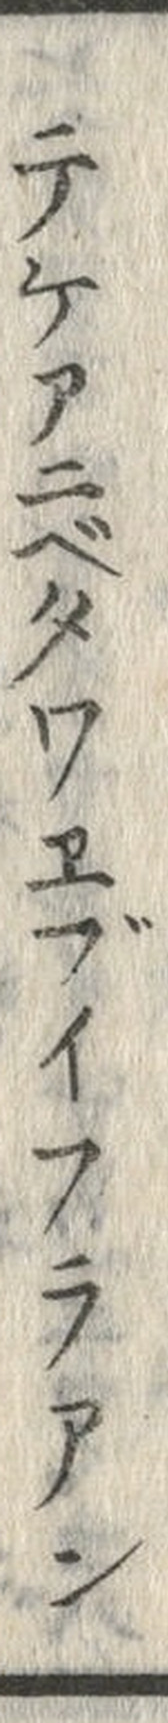テケアニベタワヱブイフラアン

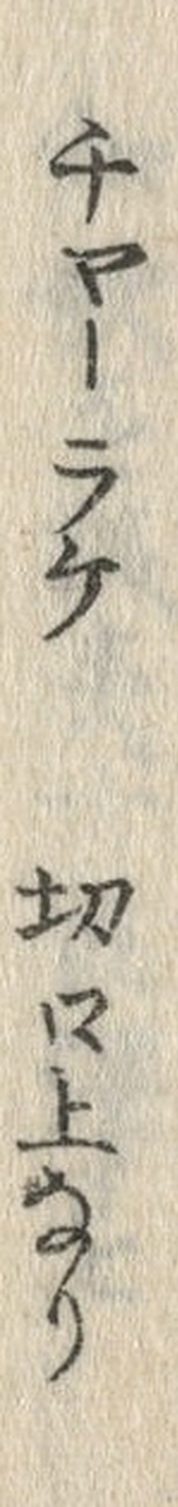チヤーラケ切口上なり

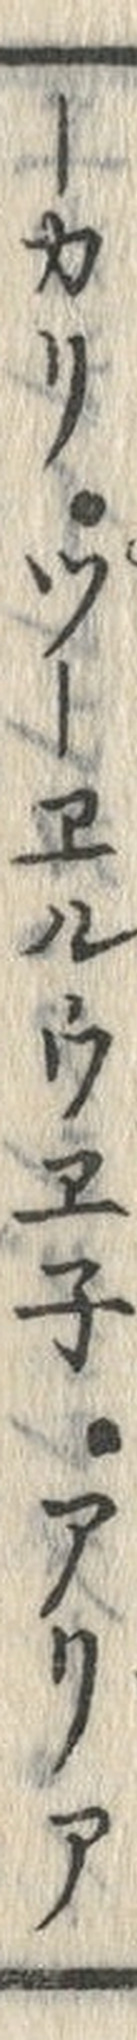ーカリ。ツ゚ーヱルウヱネ。アリア
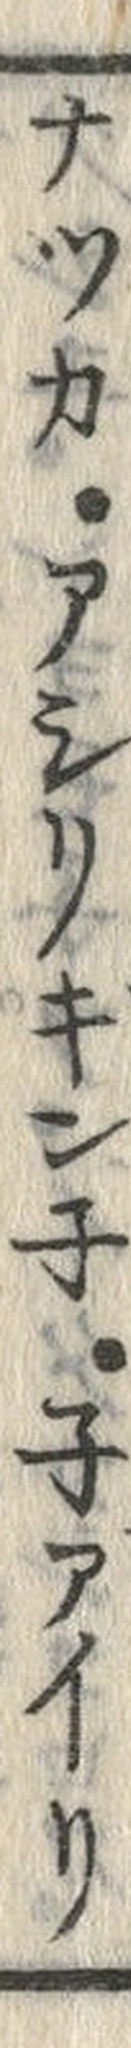ナツカ。アシリギンネ。ネアイリ
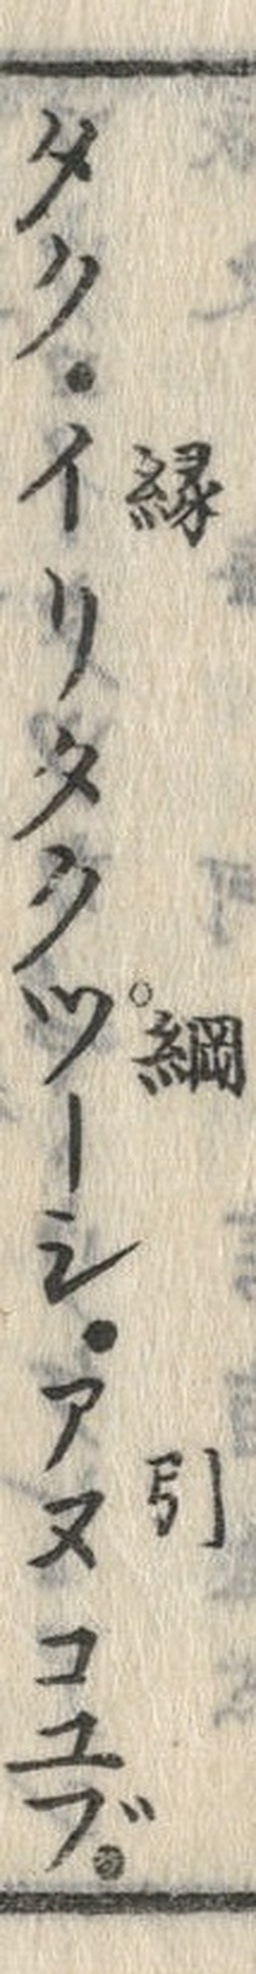タク。イリタクツ゚ーシ。アヌコユブ。
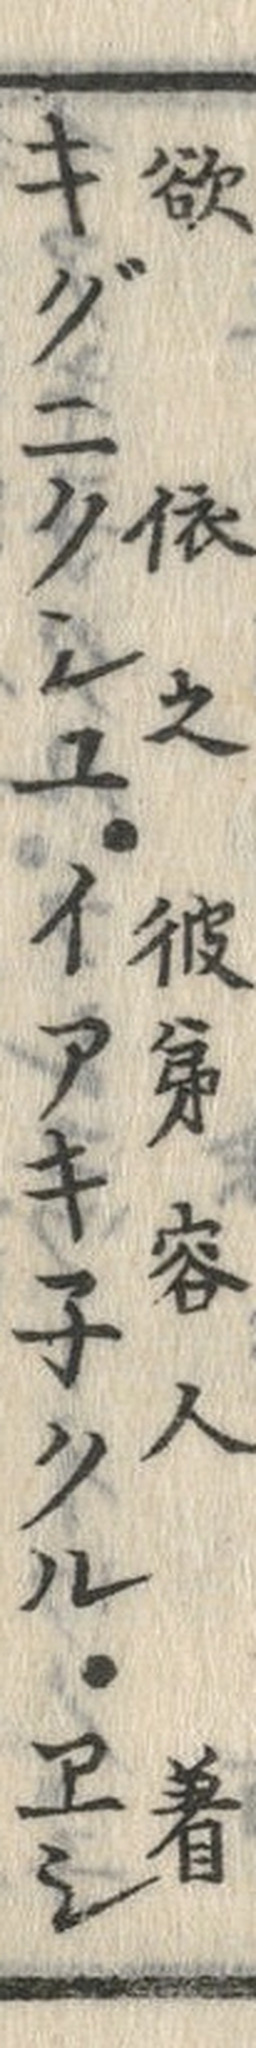キグニクシユ。イアキネクル。ヱシ
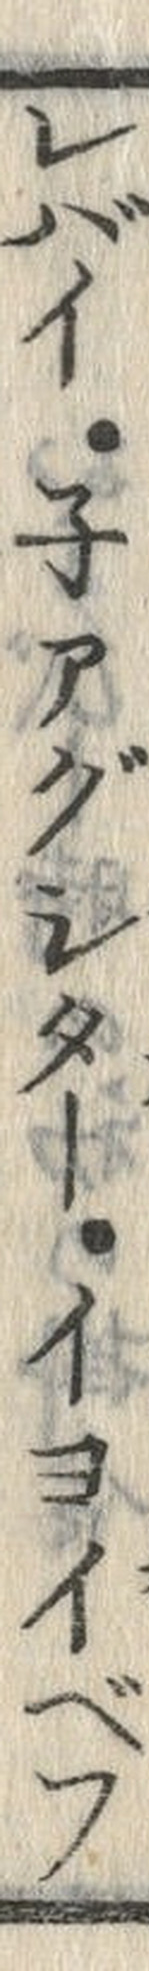レバイ。ネアグシター。イヨイベフ
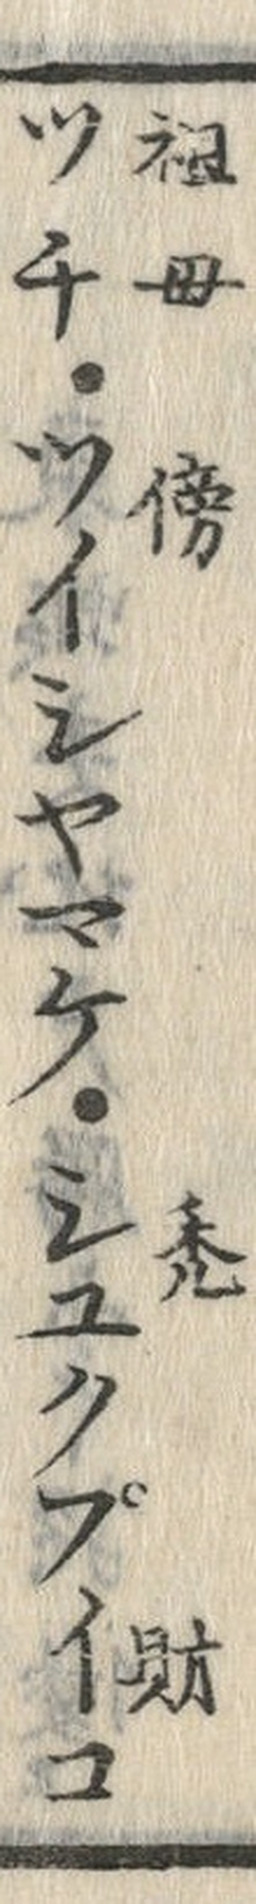ツチ。ツイシヤマケ。シユクプイコ

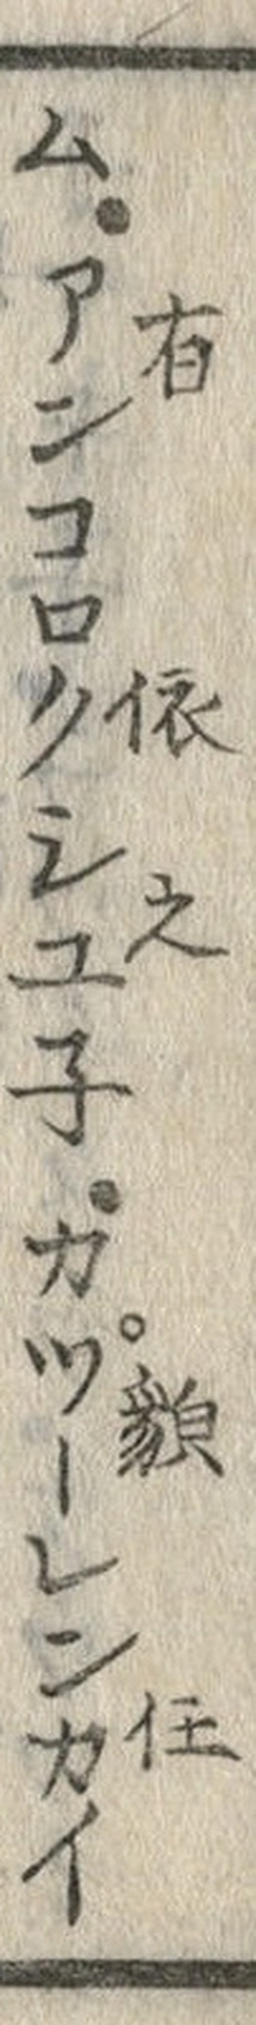ム。アンコロクシユネ。カツ゚ーレンカイ
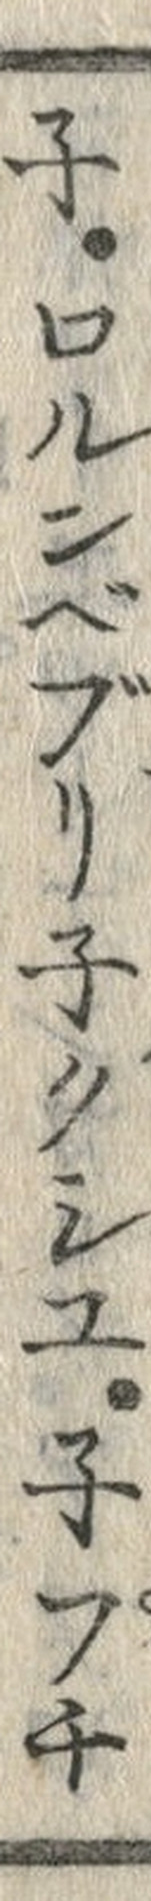ネ。ロルンベブリネクシユ。ネプチ
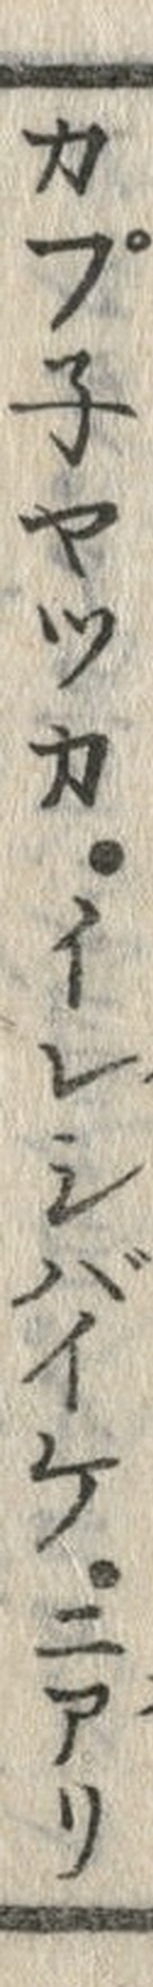カプネヤツカ。イレシバイケ。ニアリ
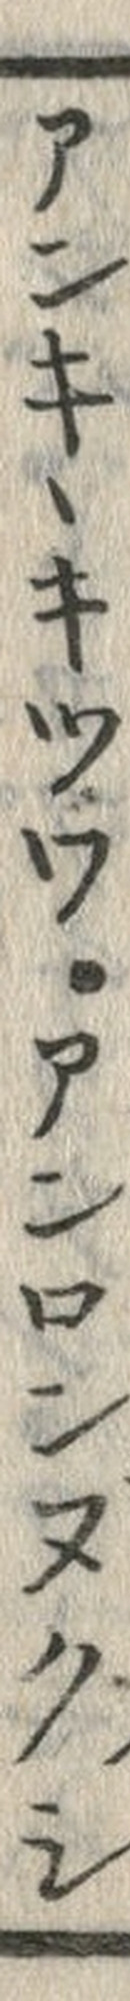アンキヽキツワ。アンロンヌクシ

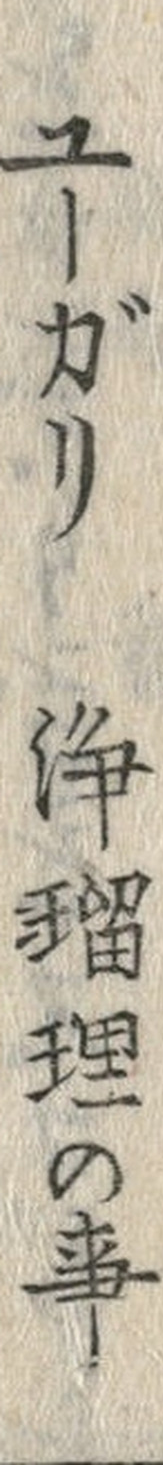ユーガリ浄瑠璃の事
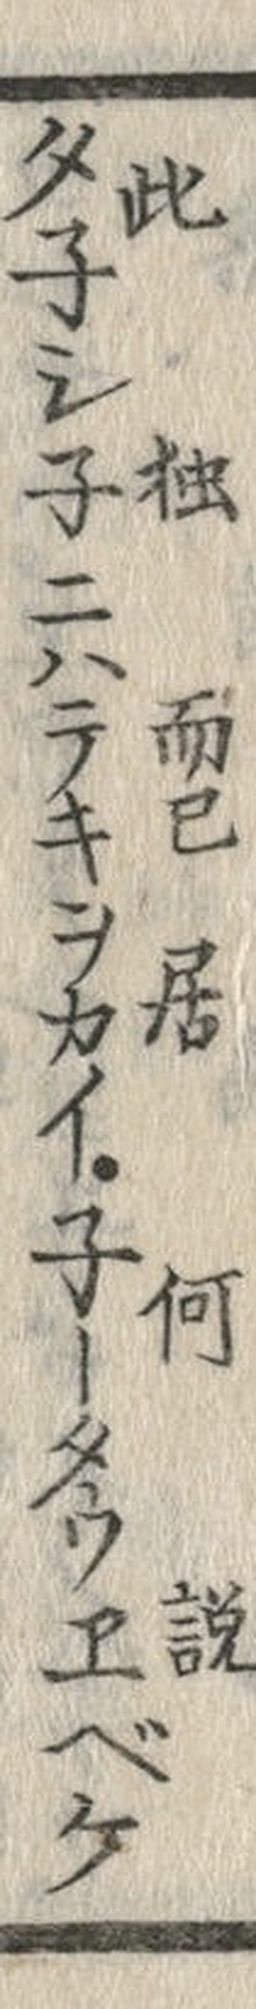タネシネニハテキヲカイ。ネータウヱベケ
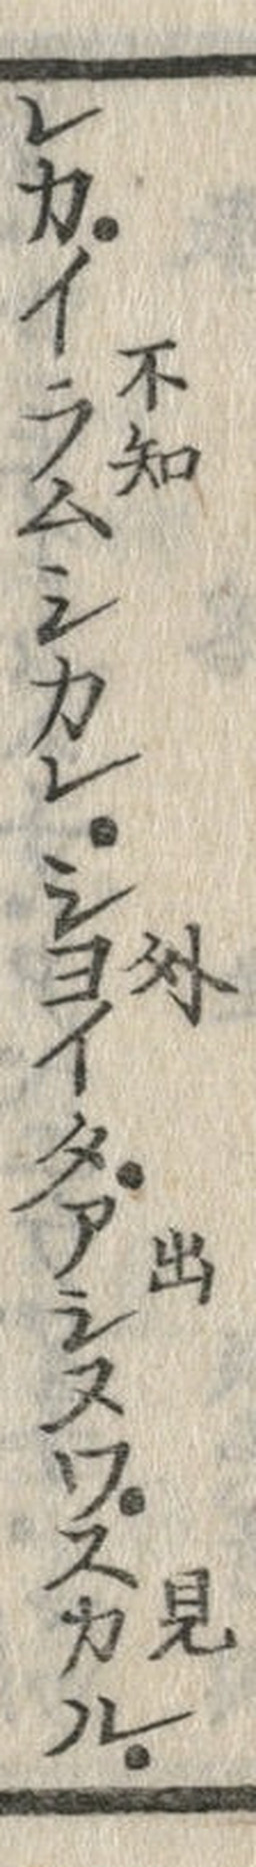レカ。イラムシカレ。シヨイタ。アシヌワ。スカル。
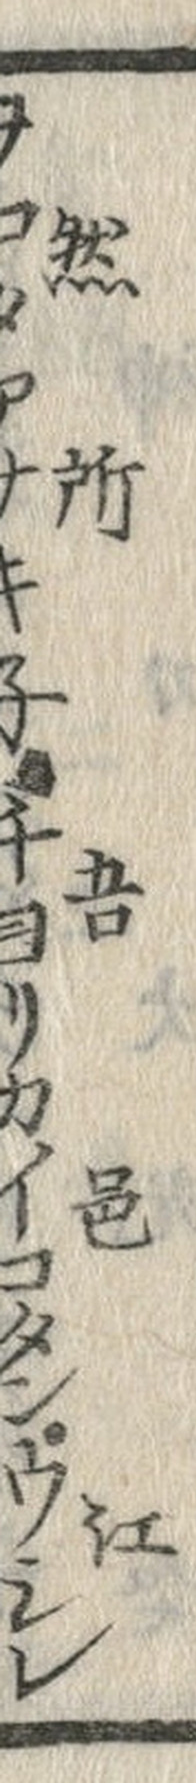ヲロタアナキネ。チヨリカイコタン。ウシレ
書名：蝦夷方言藻汐草　坤巻
